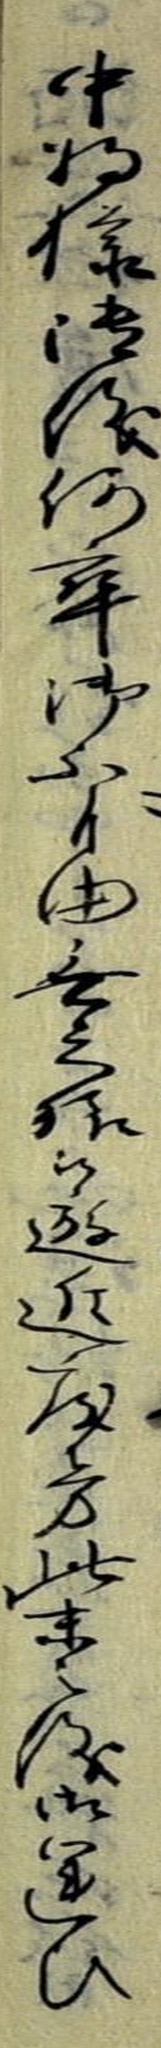中将様御儀何卒御不自由無之様被遊進度旁此末之儀御運ひ
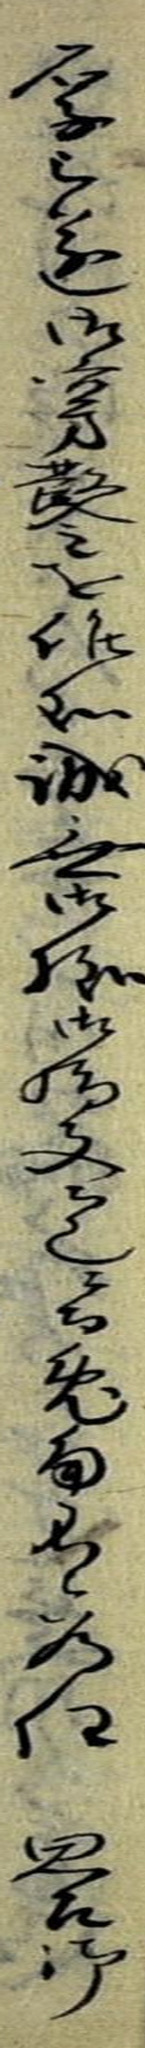厚被遂御穿鑿を候処誠無御拠御指支而已に而兎角不被為任思召御
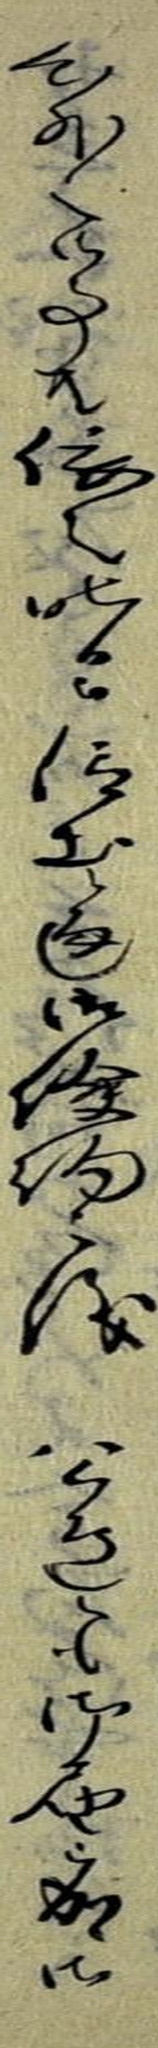心外之御事共依之昨日被仰出候通御倹約之儀公辺へも御届被成候御
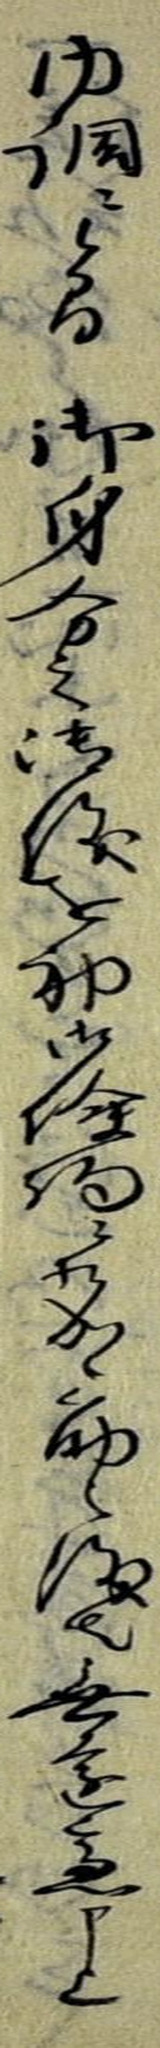内調に候間御身分之御儀を初御倹約に相成候筋之儀は無遠慮申上
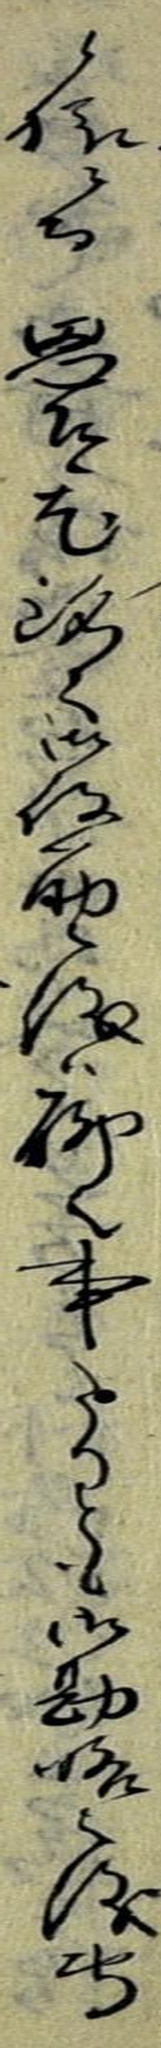候様に被思召候尤銘々御役筋之儀は聊之事たりとも御勘略之儀専
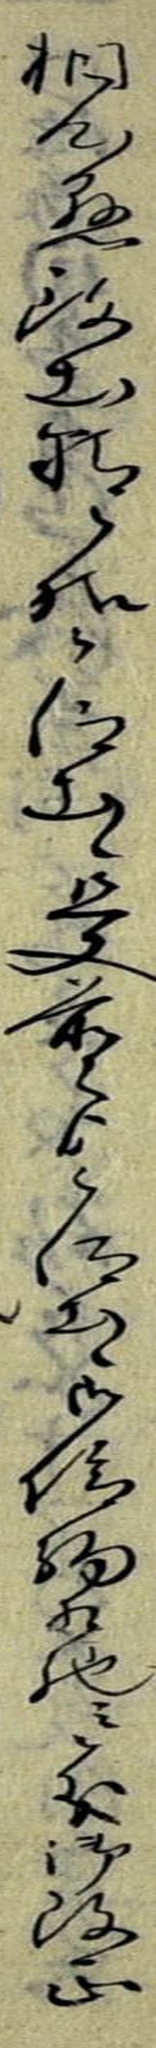相心懸致出精候様被仰出候且又前々ゟ被仰出候御倹約相弛み候義御改正
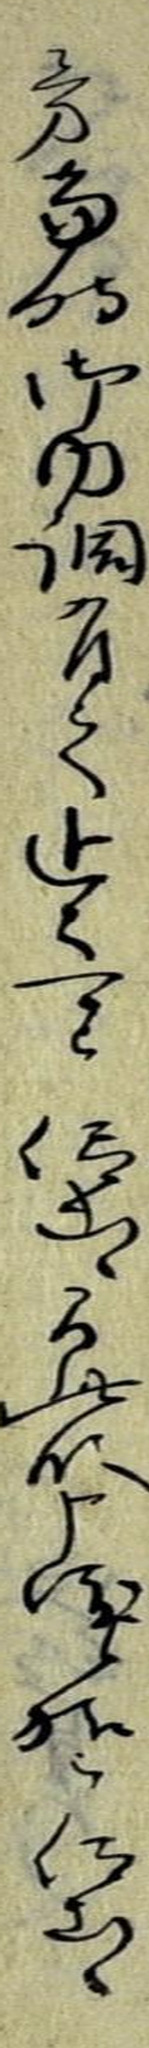旁当時御内調有之追々可被仰出候間此段申渡候様被仰出候
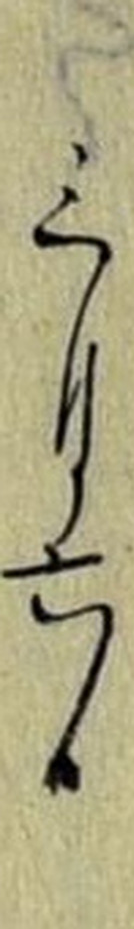三月六日
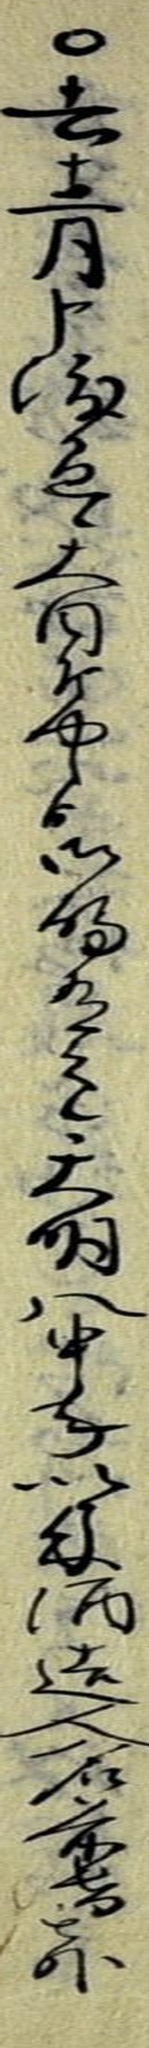○去十二月申渡置候大目付中ゟ御触有之候天明八申年以来酒造人名前替其外
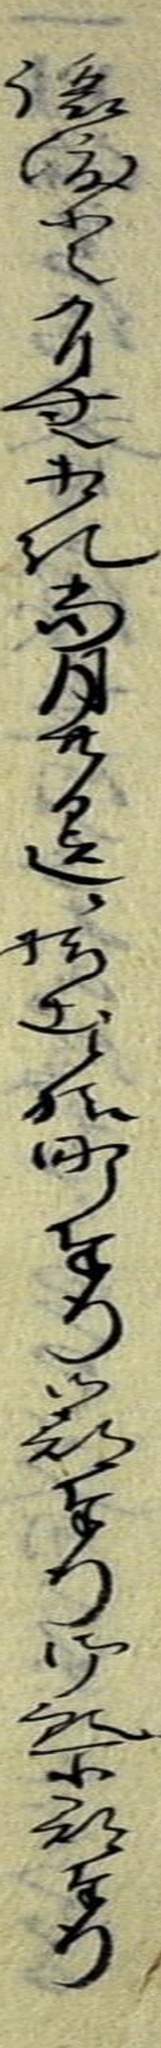譲渡等之有無相糺当月廿日迄に指出候様町奉行御郡奉行御預所郡奉行
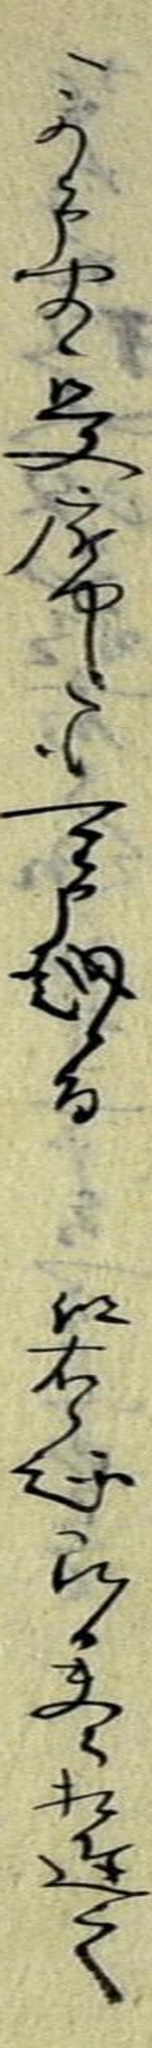へ可被申聞候且又府中へも可被申渡候旨但右之趣即日夫々相達之
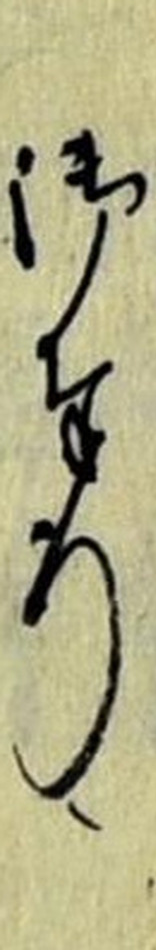御奉行
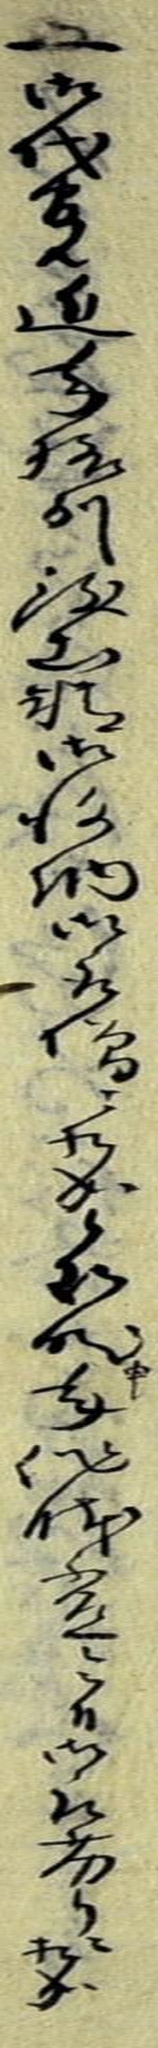一御代官共近年格別致出精御収納御取増に相成候折昨申年作体不宜候に付御取劣りに相成

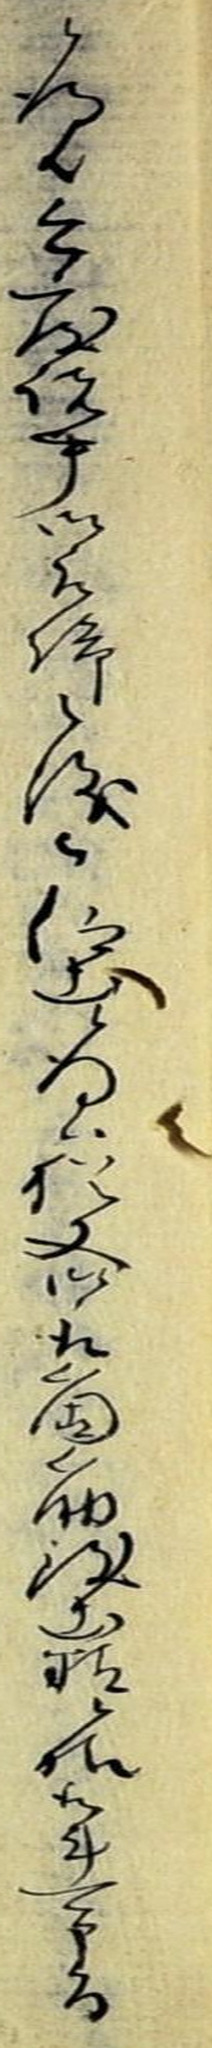候得共今度諸事御取締之儀被仰出候得は猶又御取箇筋致出精候様取斗可申旨
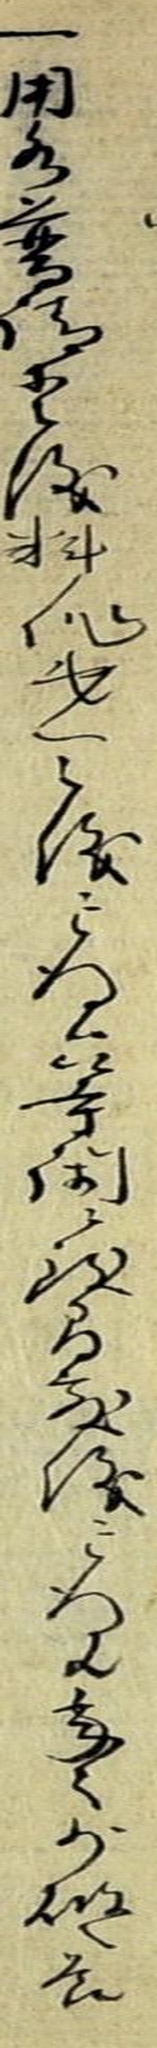一用水普請等之儀料作第一之儀に候得は等閑に致間敷儀に候得共年々少破之節
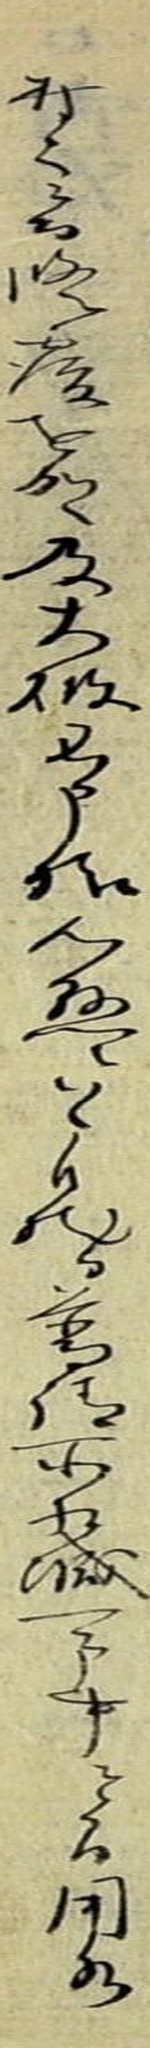村々に而修覆を加へ及大破不申様心懸候はヽ自然と普請所相減可申事に候間用水
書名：命令之部 四
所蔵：福井県文書館 Fukui Prefectural Archives
